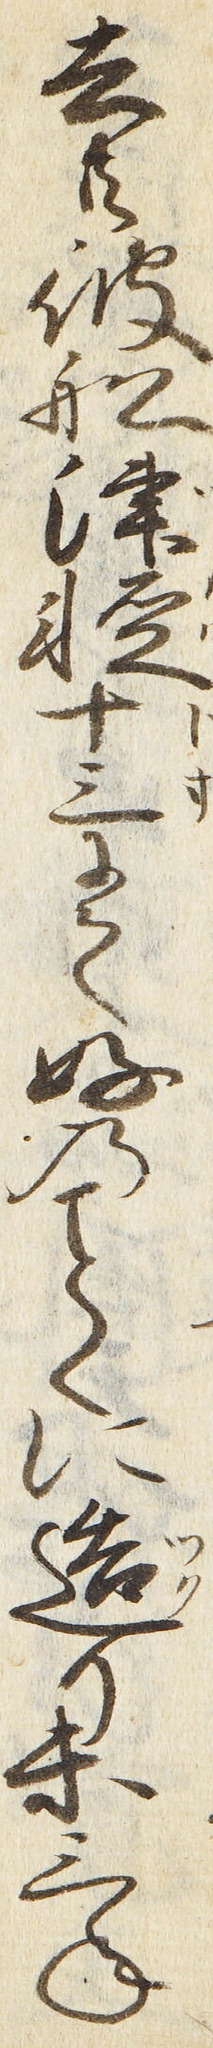去共彼船津軽十三にて好のことくに造り未三年
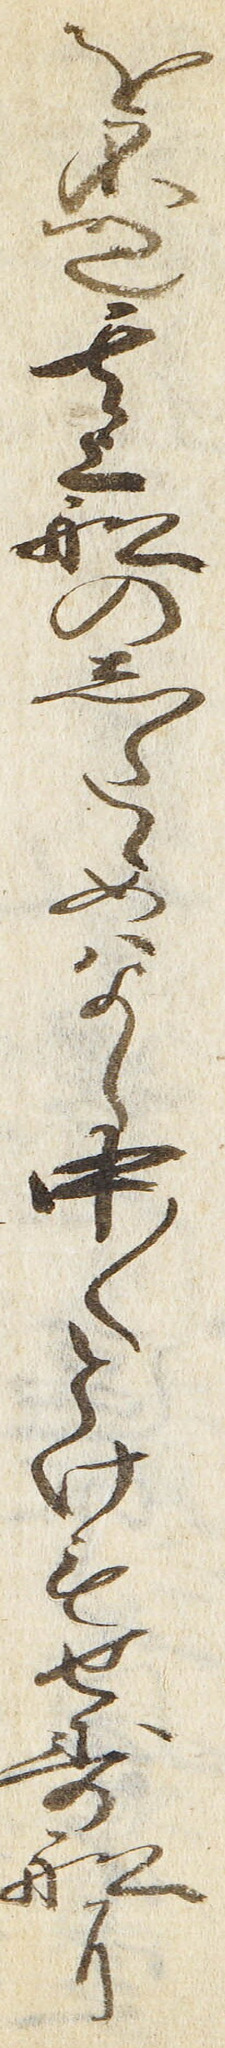を不過其上船のしたゝめはよし中〳〵とけもせす船に
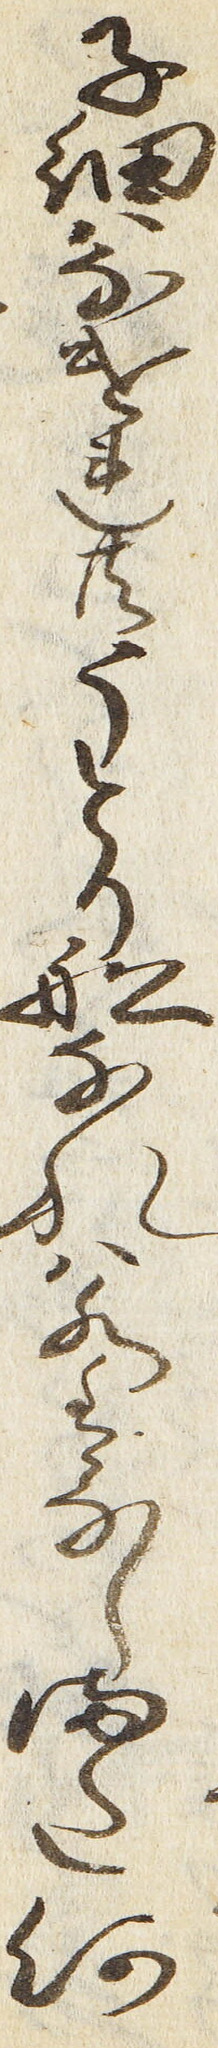子細はなけれ共うとり船なれは水主なしまた何
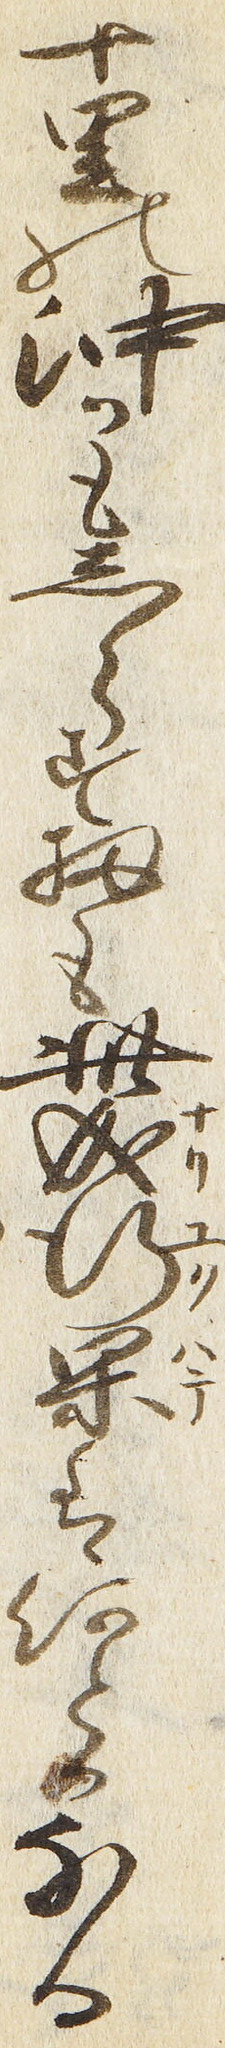十里の沖かもしらす扨も此成行果は何とかなる
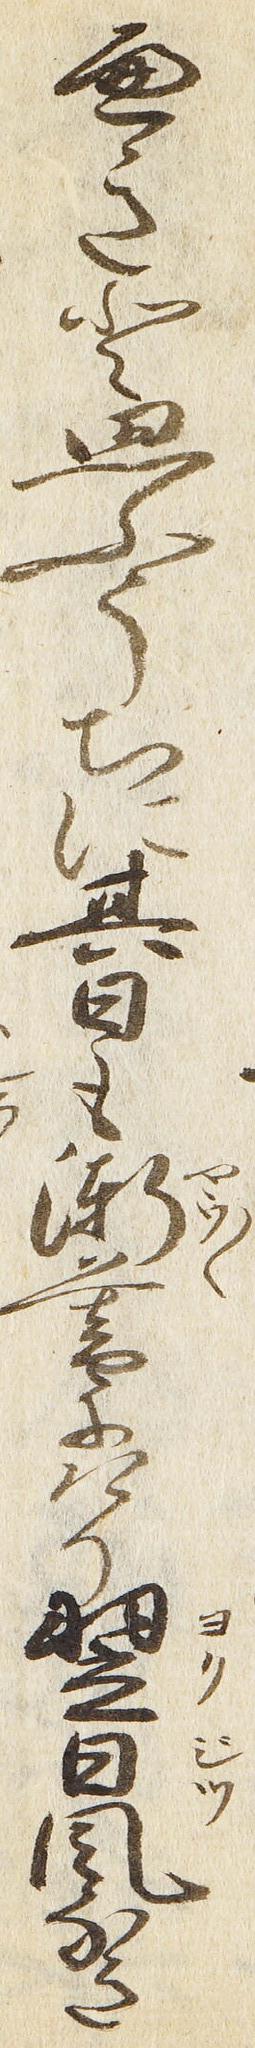へきと思ふうちに其日も漸暮にけり翌日風なき
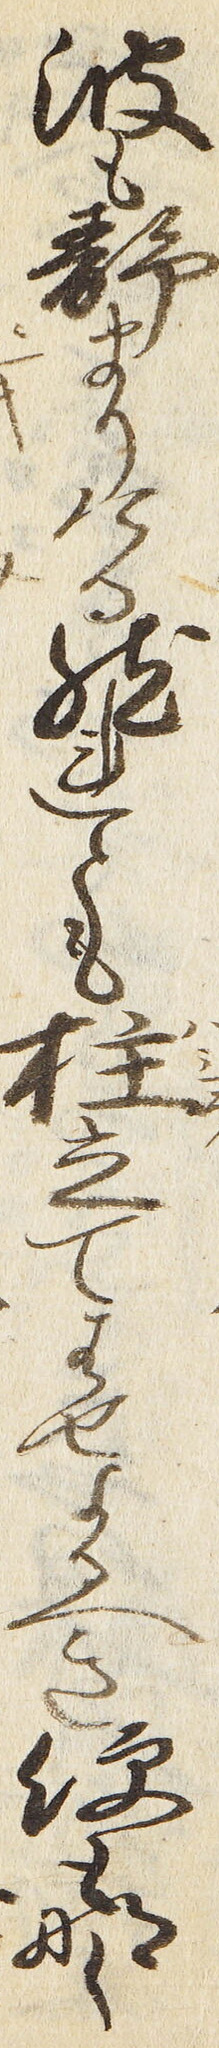波も静まりける然れとも柱立てはせよるへき便もなく
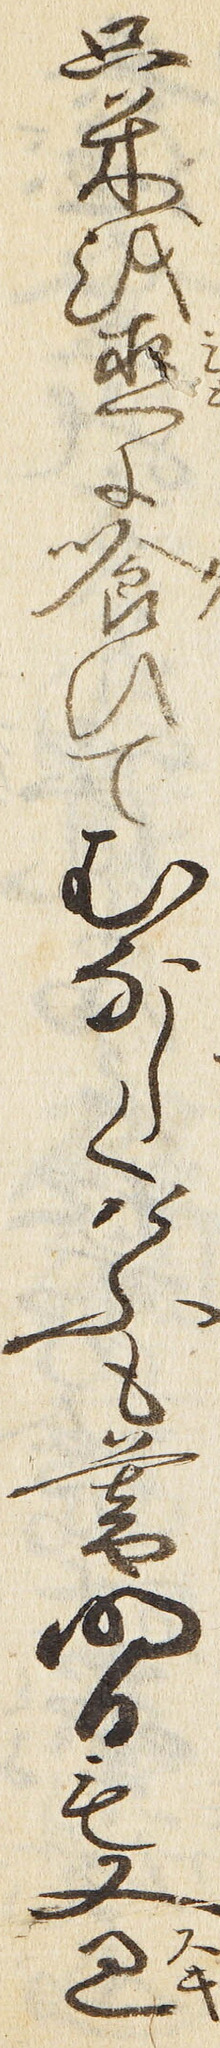只米を直に喰ひてむなしくけふも暮明日も又過
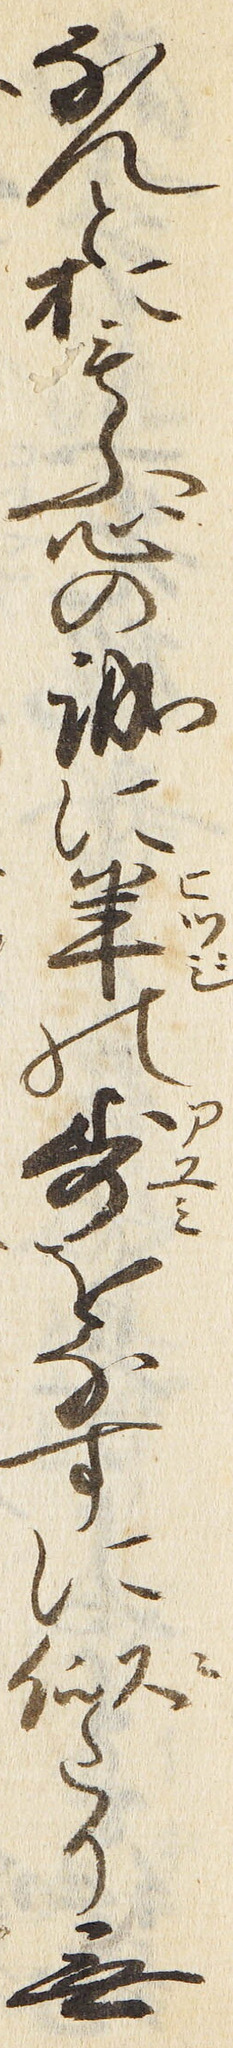なんとおもふ心の誠に羊の歩をなすに似たり無
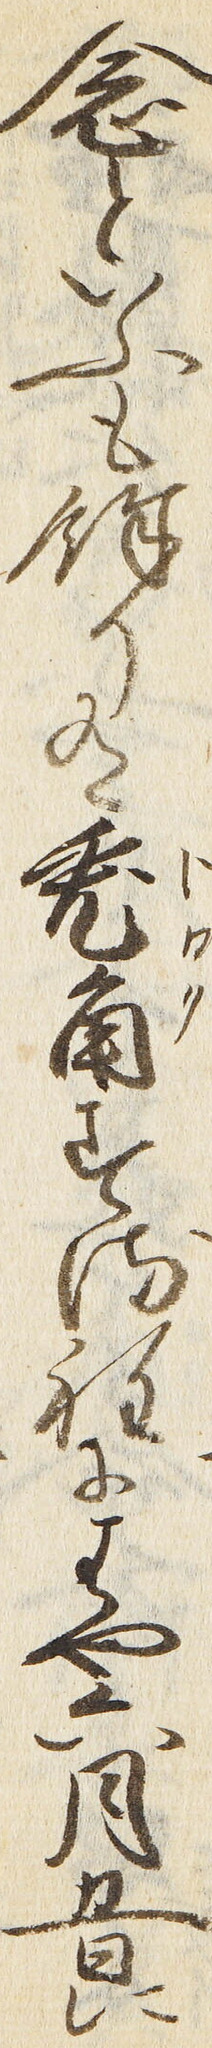念といふも余り有兎角する程にはや六月五日に
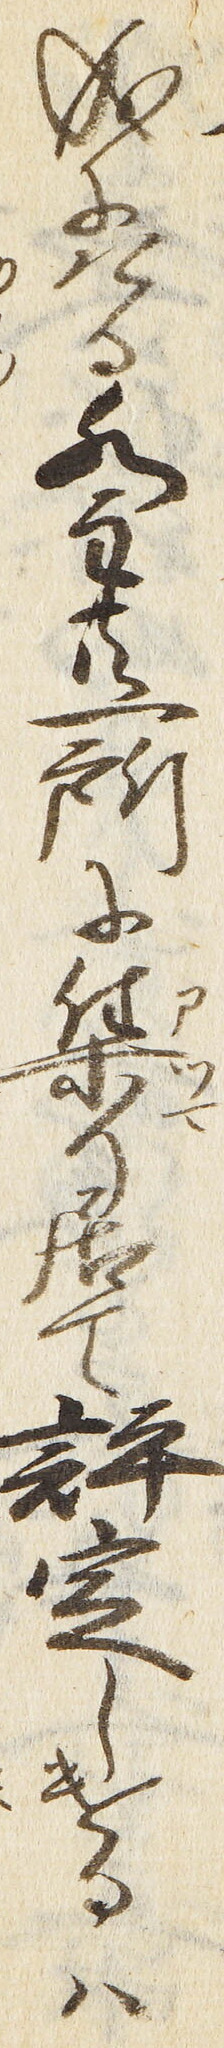成にける水主共一所に集り居て評定しけるは
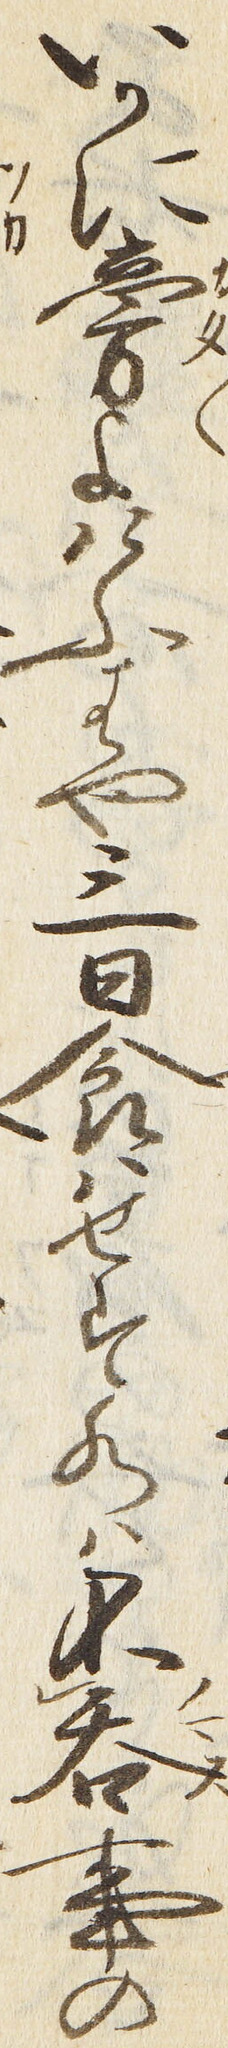いかに旁よけふはや三日食はせす水は不呑事の
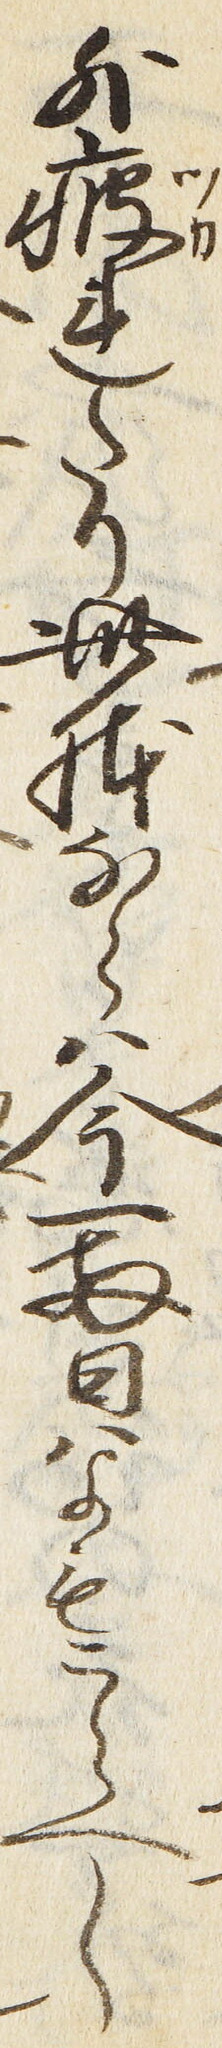外疲れたり此体ならは今一両日はよもこらへし
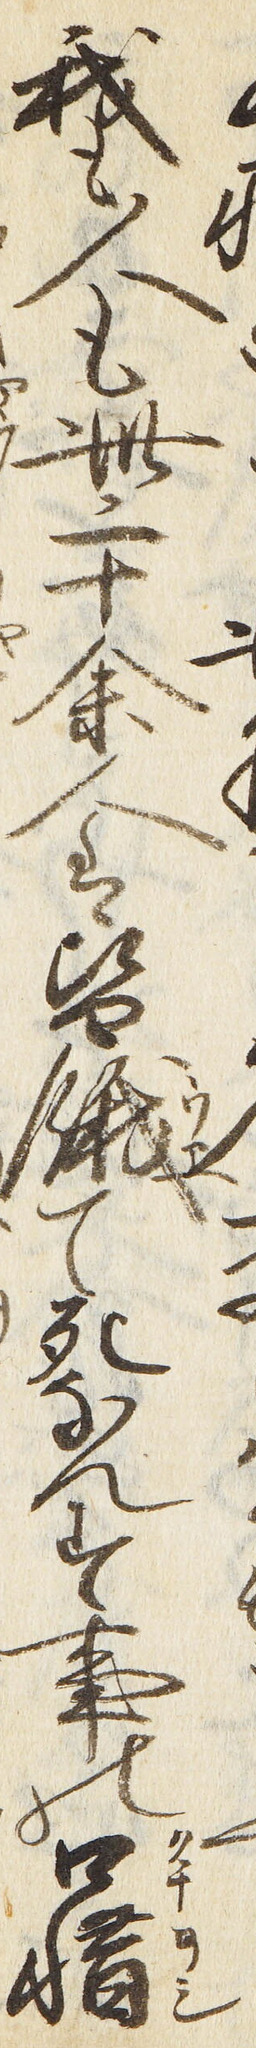我も人も此二十余人は皆餓て死なんす事の口惜
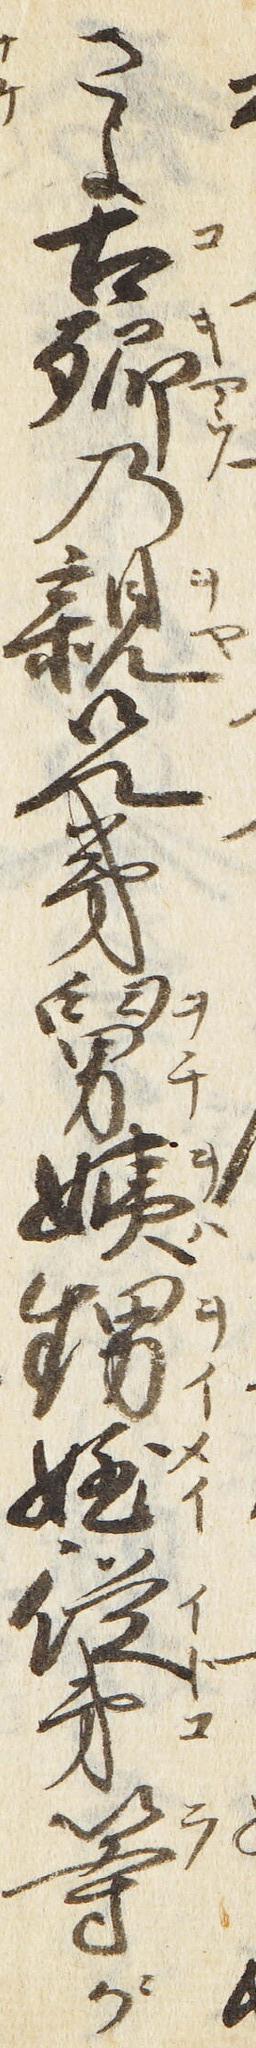さよ古郷の親兄弟舅姨甥姪従弟等が
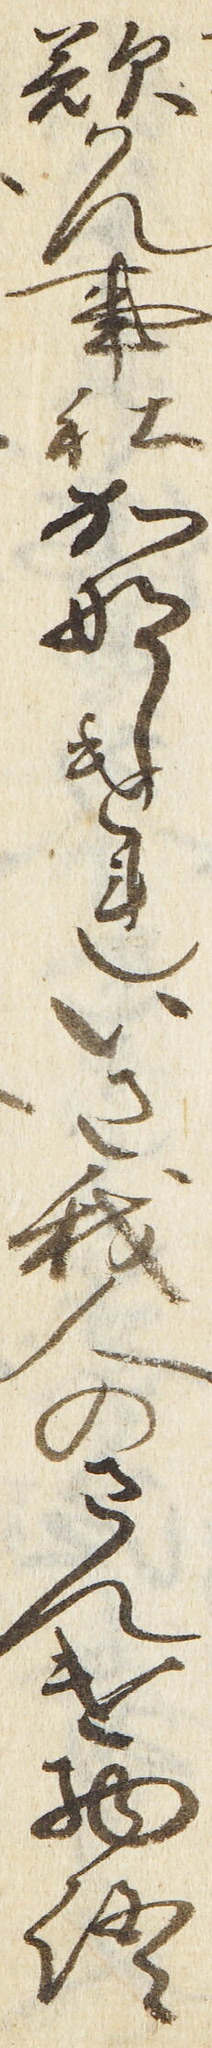歎かん事社かなしけれいさ我人のさんけ物語
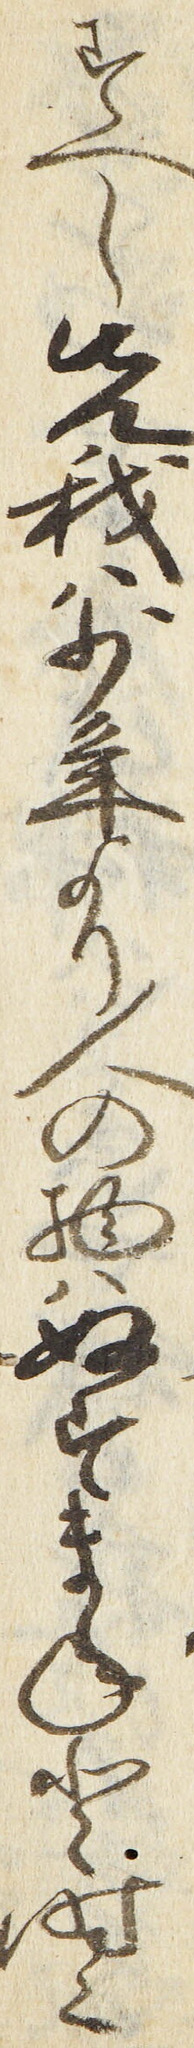すへし先我は少年より人の物はぬすまねと時々
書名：海陸世話日記
